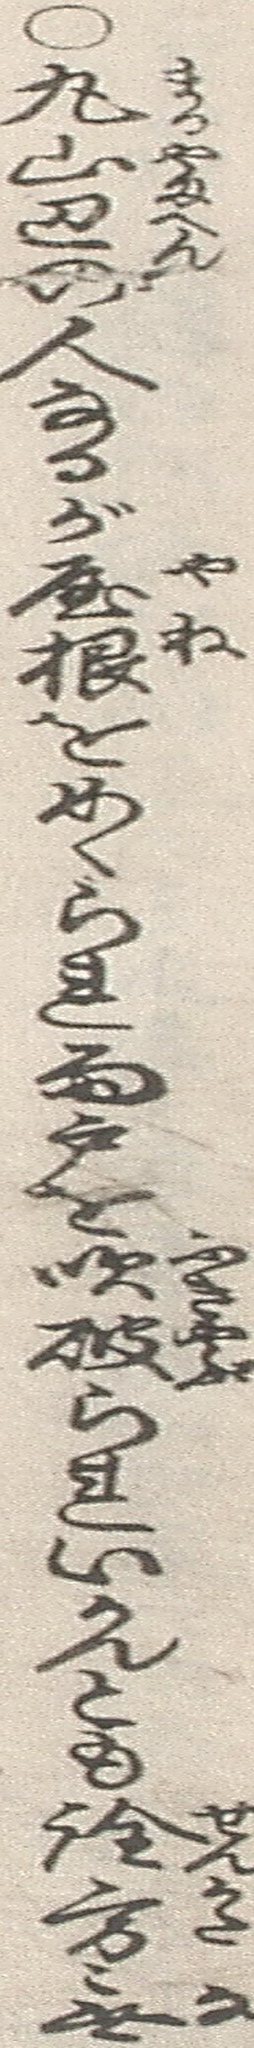◯丸山辺の人なるが屋根をめくられ雨戸を吹破られいかんとも詮方二無
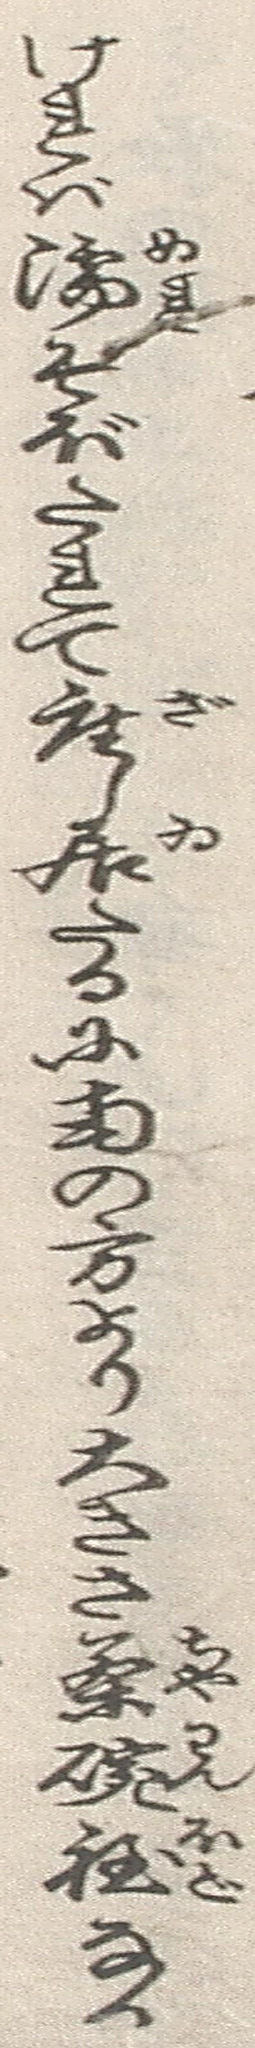けれバ濡そぼたれて座し居たるに南の方より大きさ茶碗程なる
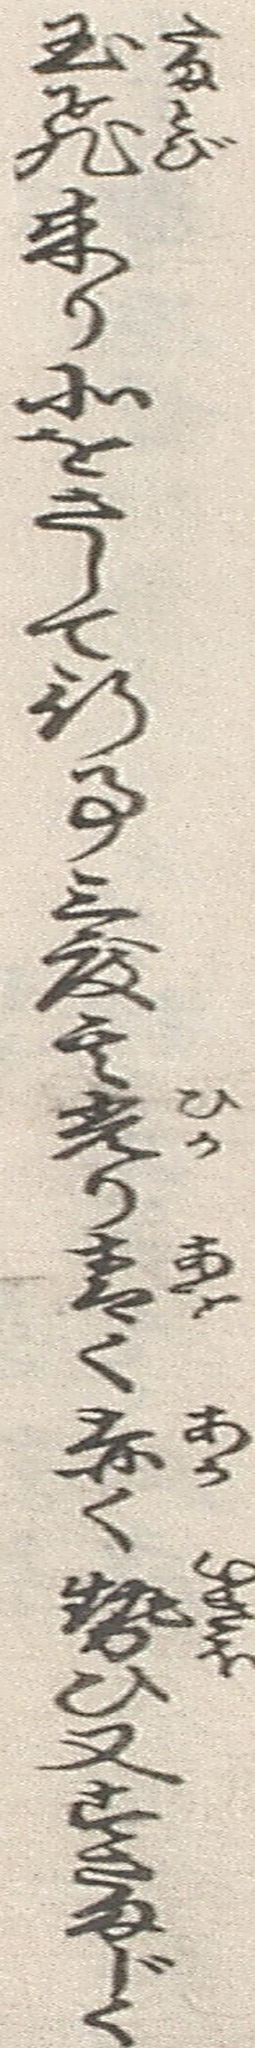玉飛来り北をさして行事三度其光り青く赤く勢ひ又すさまじく
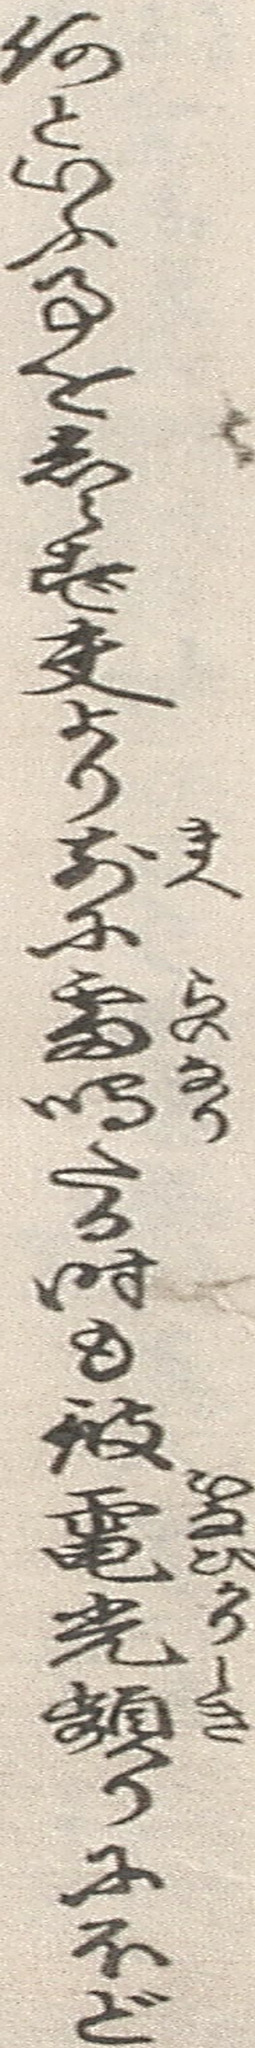何といふ事をしらず夫より前に雷鳴たる時も彼雷光頻りにほど
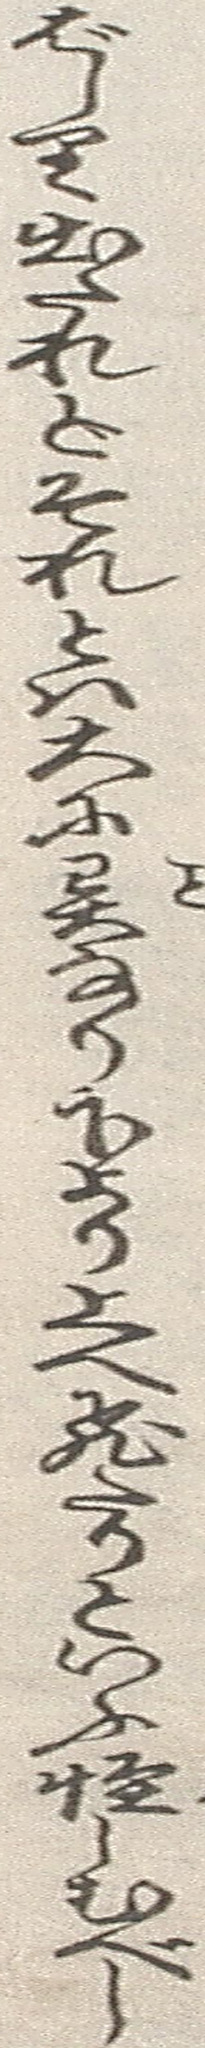ばしり出たれどそれとハ大に異なり下より上へ飛たりといふ怪しむべし
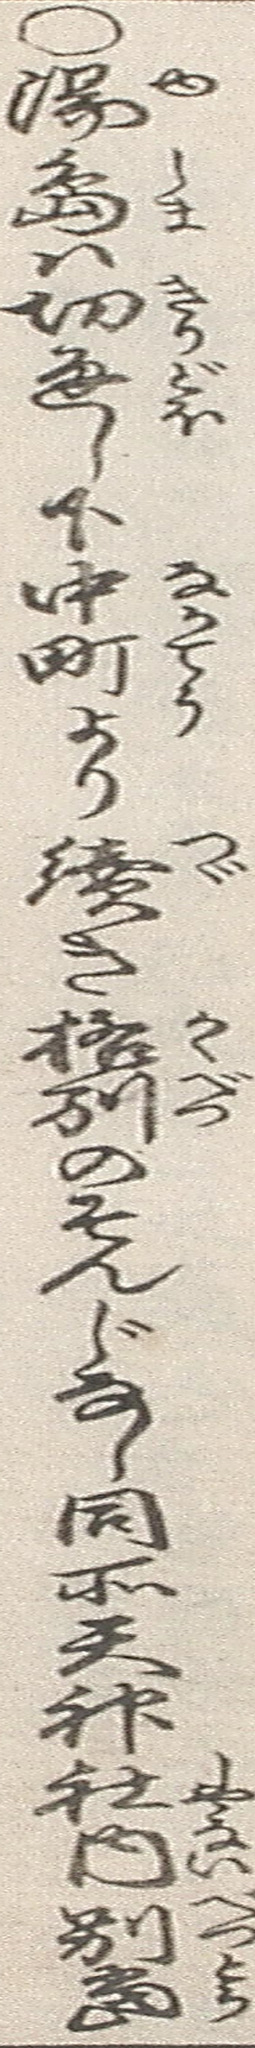◯湯嶋は切通し下中町より続き格別のそんじなし同所天神社内別当
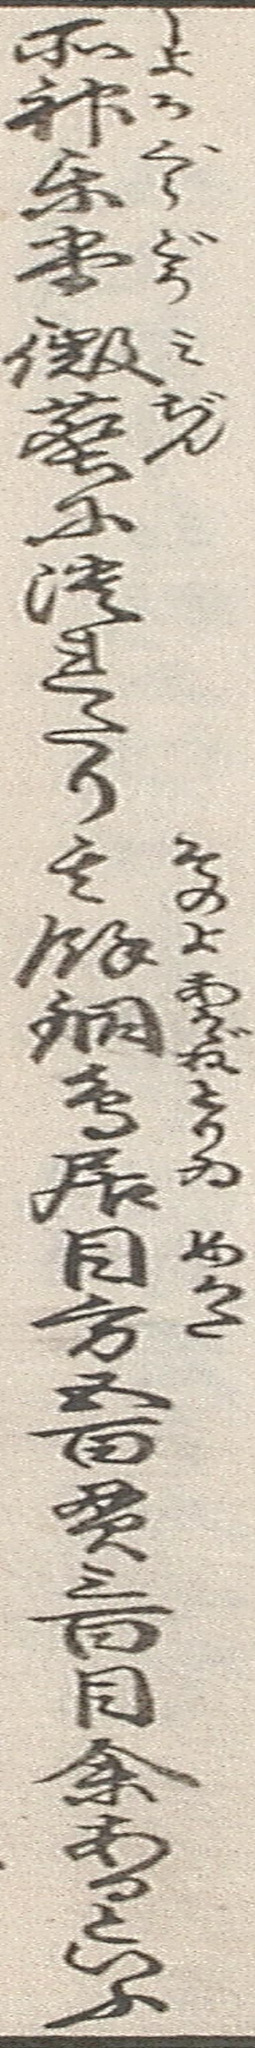所神楽宮微塵に潰れたり其餘銅鳥居目方五百貫三百貫余あるといふ
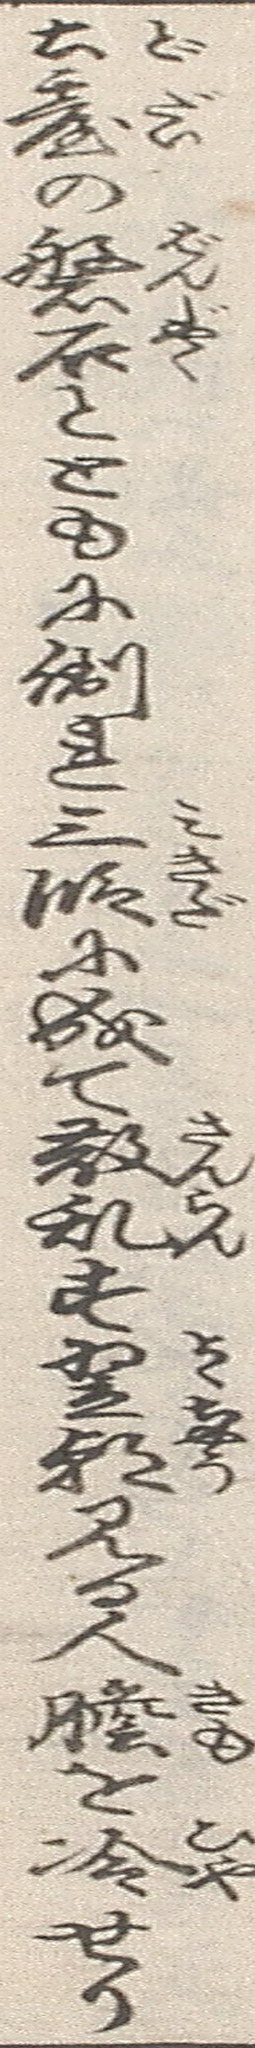土台の盤石をともに倒れ三段に成て散乱す翌朝見る人膽を冷せり
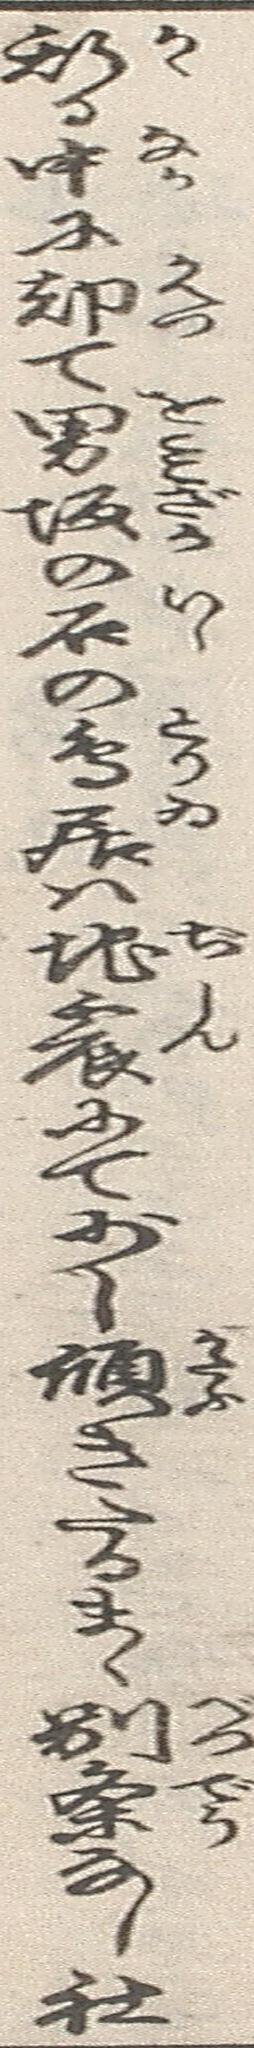斯る中に却て男坂の石の鳥居ハ地震にて少し傾きたるまゝ別条なし社
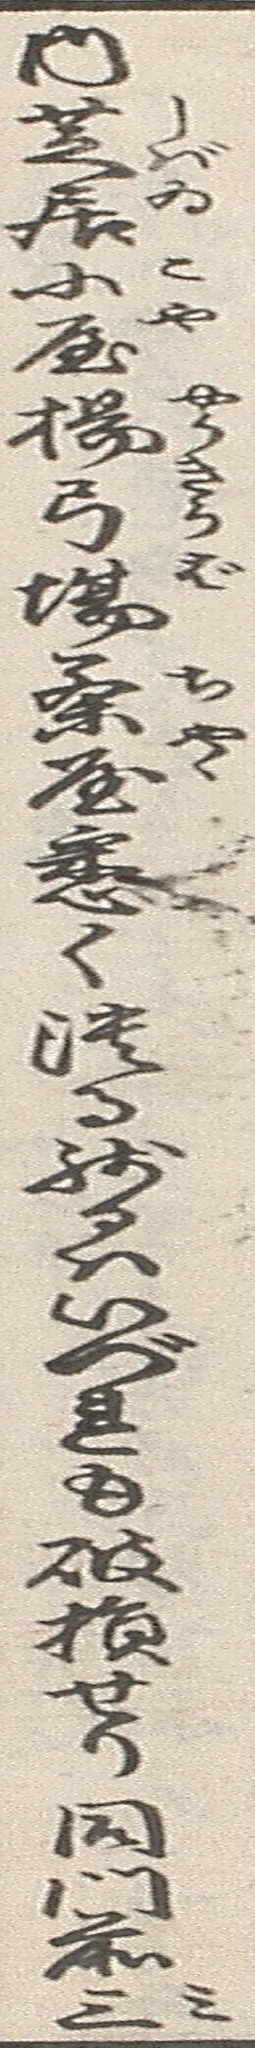内芝居小屋揚弓場茶屋悉く潰れ残るハいづれも破損せり同門前三
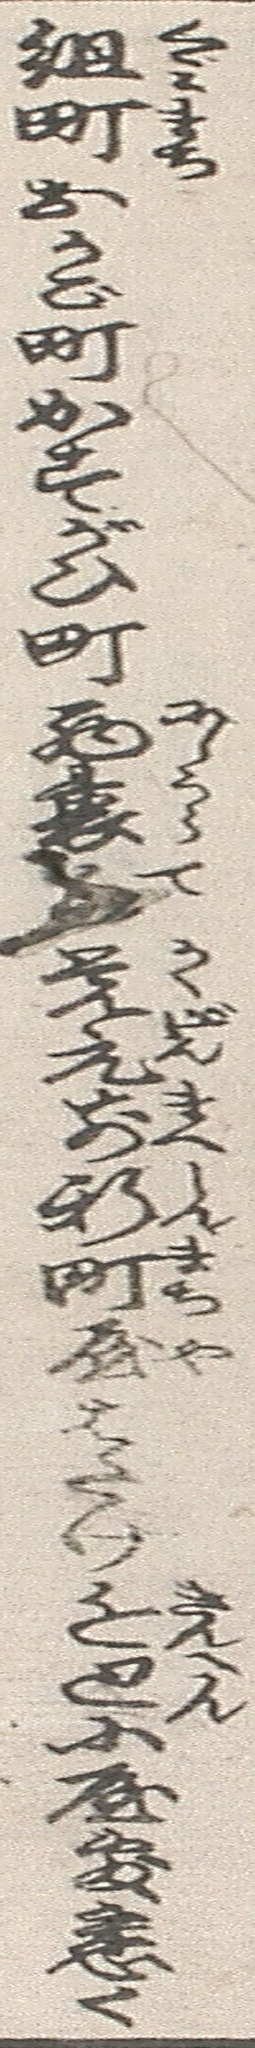組町おかご丁かすがひ町西裏手覚元前新町屋はたけ近辺小屋敷悉く
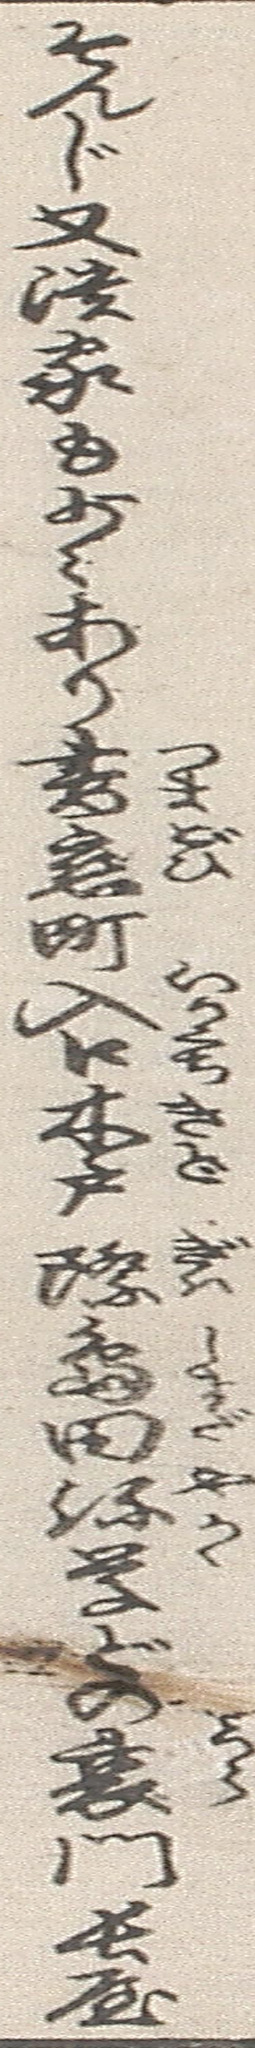そんじ又潰家も少々あり妻恋町入口木戸際嶋田弥学どの裏門長屋
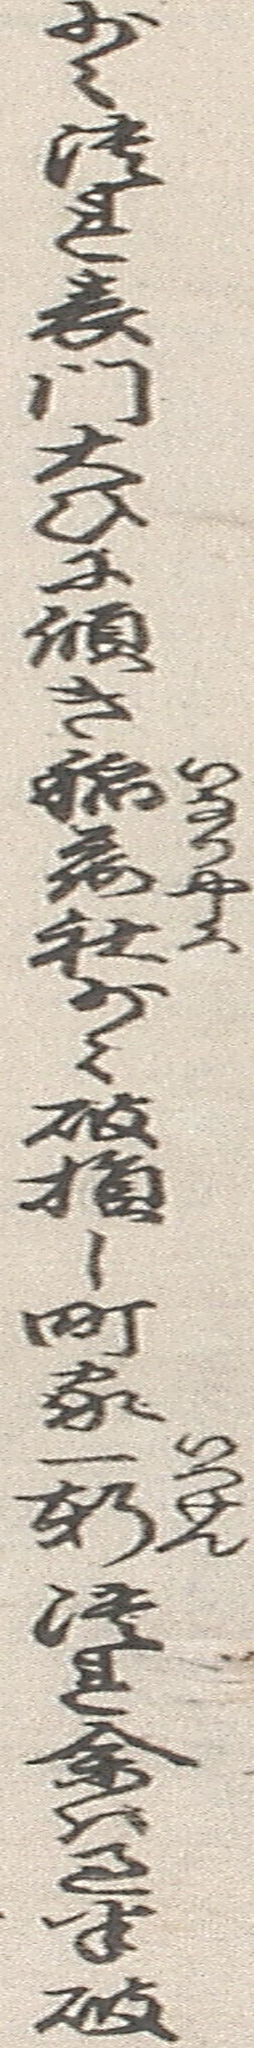少々潰れ表門大ひに傾き稲荷社少々破損し町屋一軒潰れ余ハ過半破
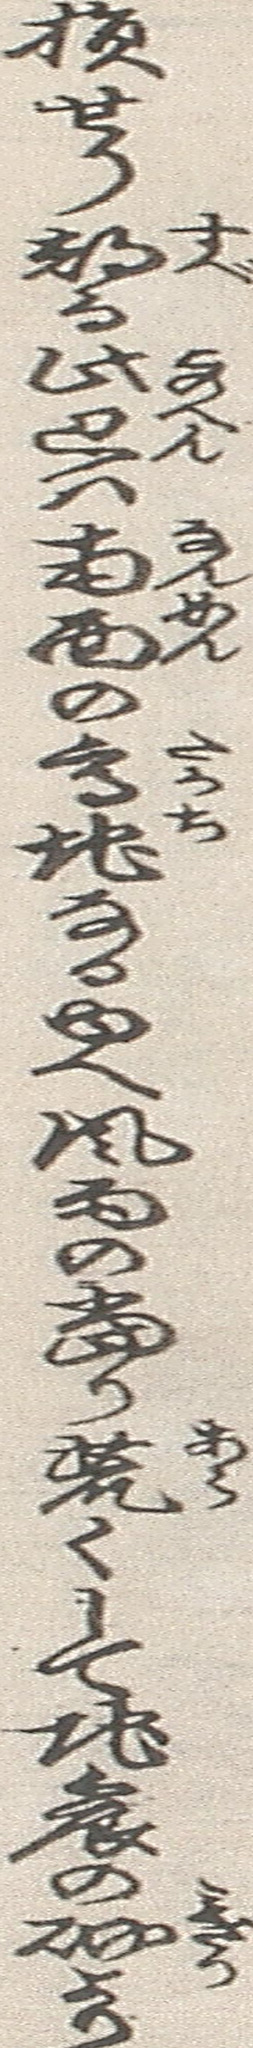損せり都而此辺ハ南面の高地なるゆへ風雨の当り荒くして地震の砌より
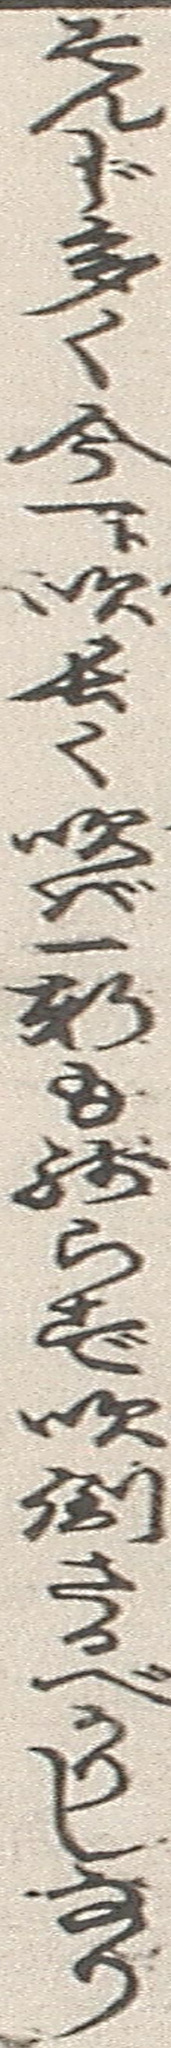そんじ多く今一ト吹長く吹バ一軒も残らず吹倒さるべかりしなり
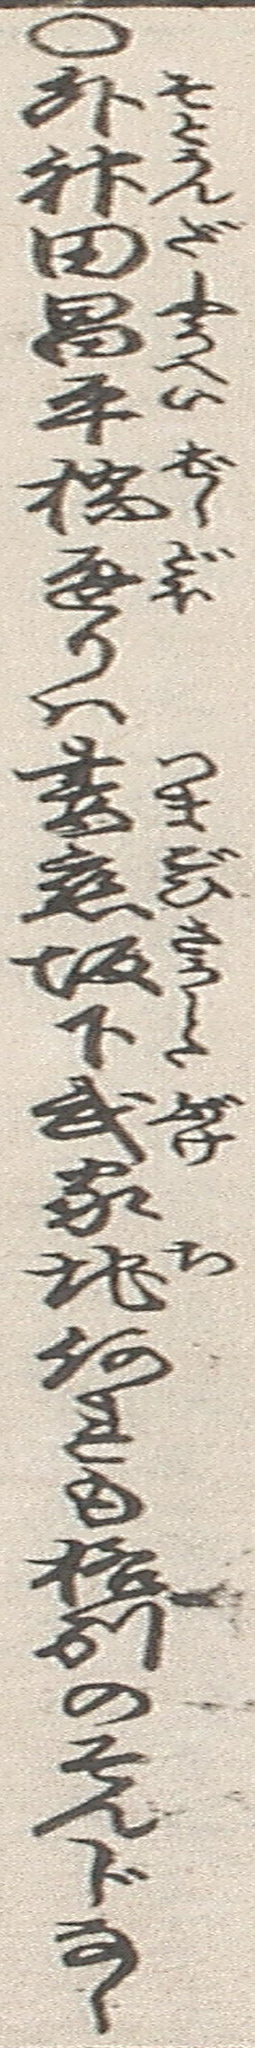◯外満田昌平橋通りハ妻恋坂下武家地何れも格別のそんじなし
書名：安政風聞集　上中下　全
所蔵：東京大学地震研究所図書室 Earthquake Research Institute Library, The University of Tokyo, JAPAN
